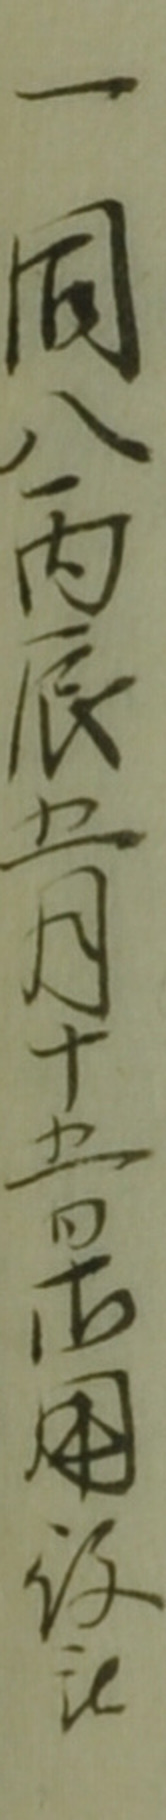一同八丙辰五月十五日御用役被
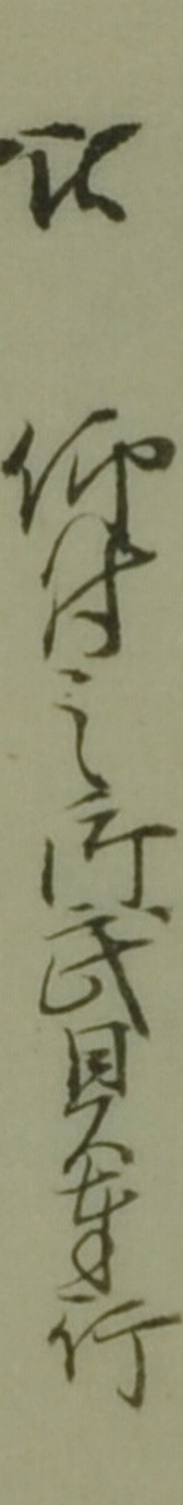被仰付之御武具奉行
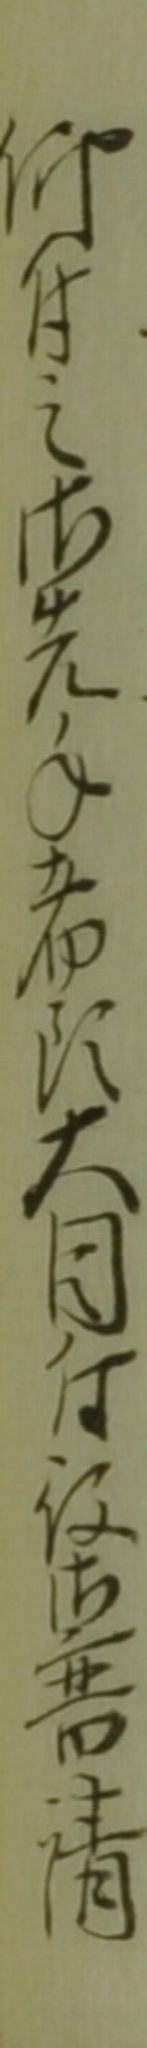仰付之御先手者頭大目付役御普請
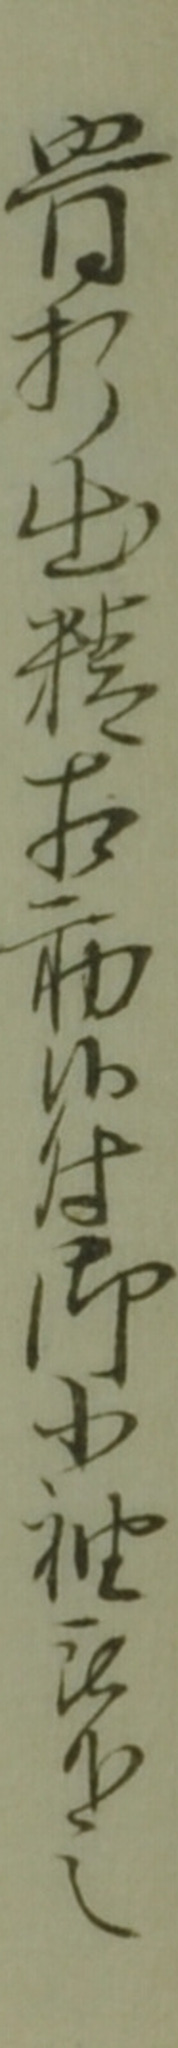骨折出精相勤候付御小袖被下之
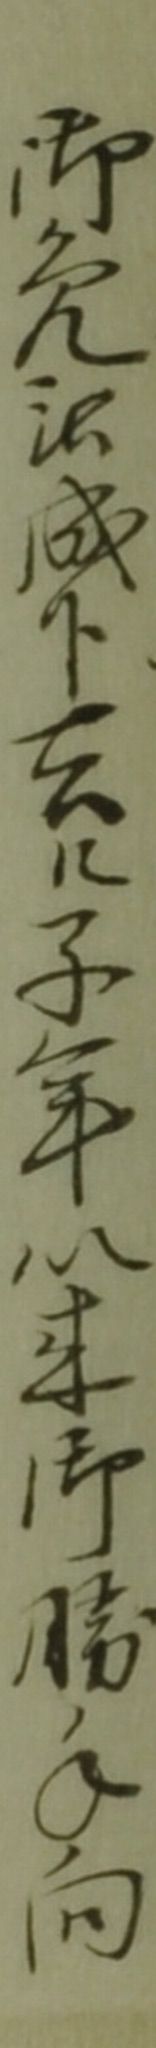御免被成下去ル子年以来御勝手向
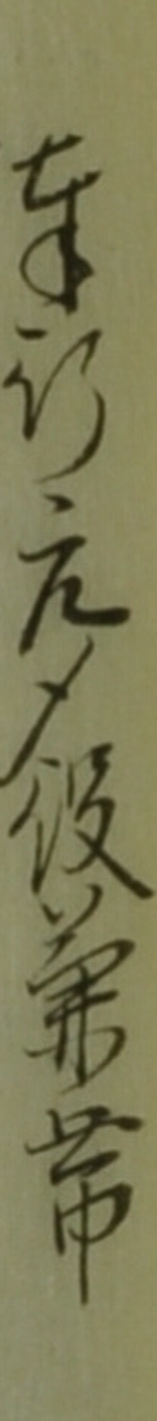奉行元〆役兼帯
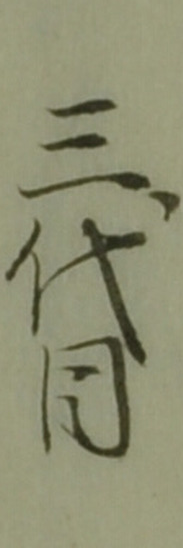三代目
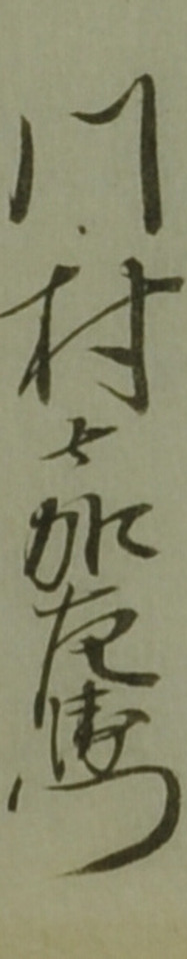川村嘉左衛門
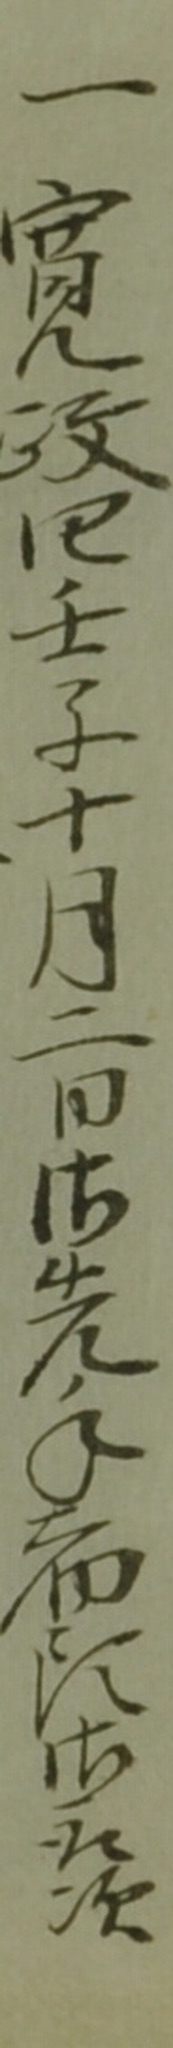一寛政四壬子十月二日御先手者頭御取次
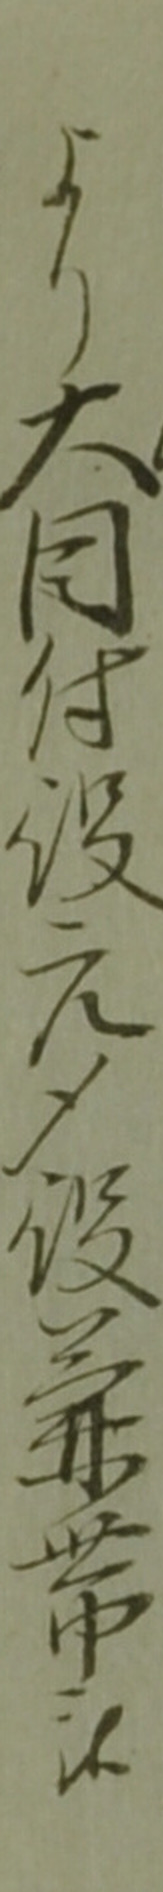より大目付役元〆役兼帯被
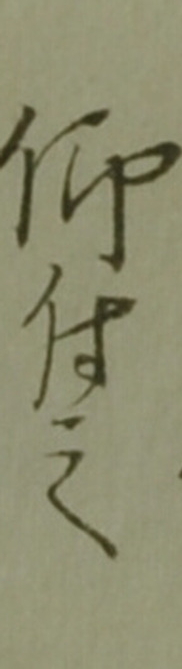仰付之
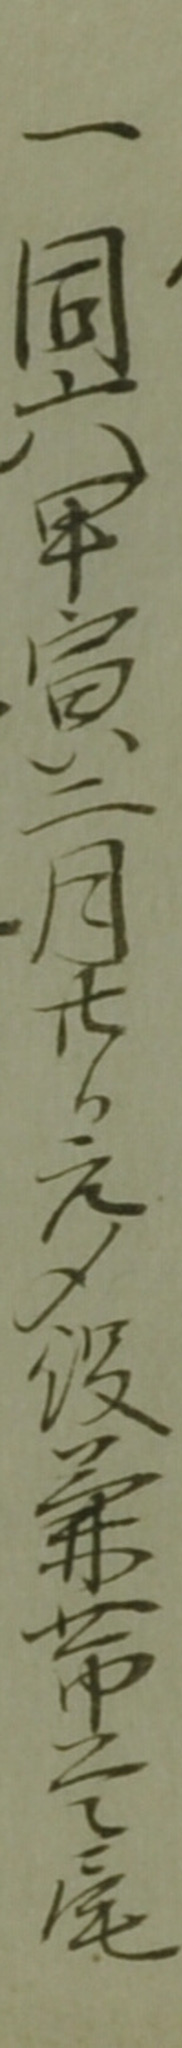一同六甲寅二月廿日元〆役兼帯首尾
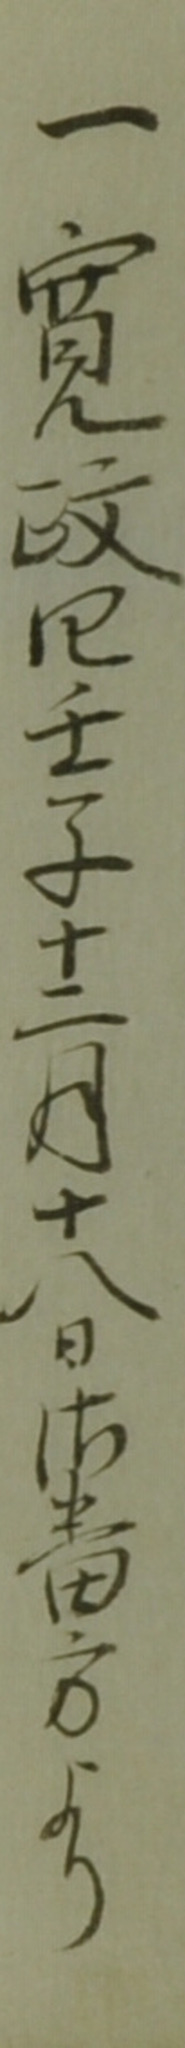一寛政四壬子十二月十八日御番方より
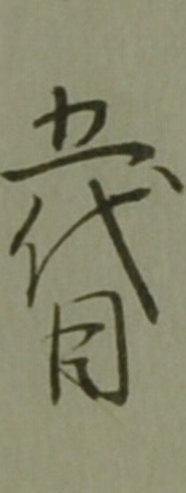五代目
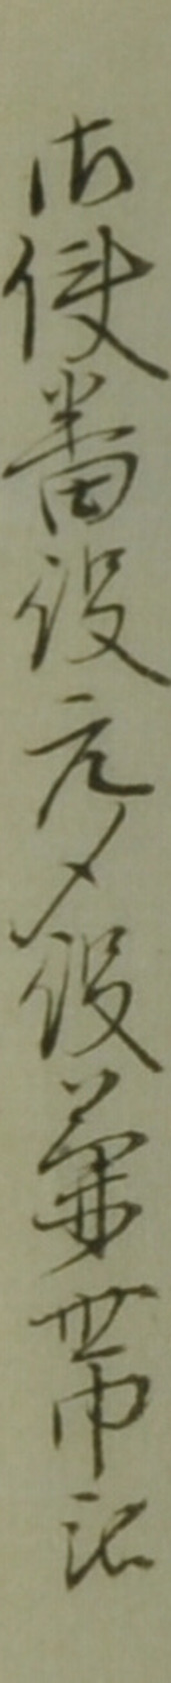御使番役元〆役兼帯被

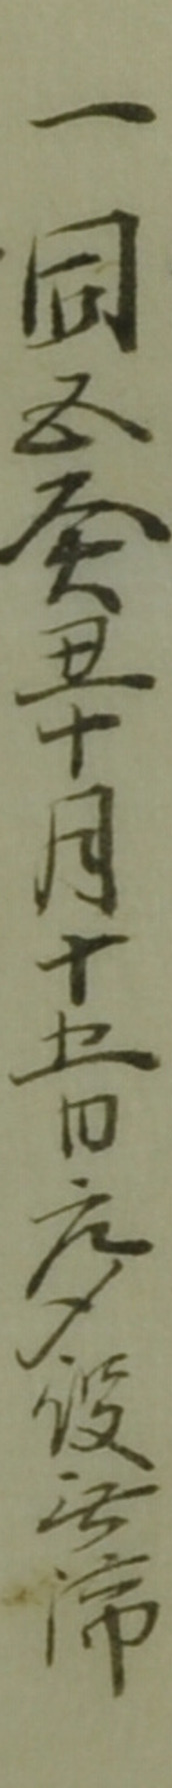一同五癸丑十月十五日元〆役無滞
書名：諸御役代々録（七）
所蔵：伊那市立高遠町図書館・合同会社AMANE
